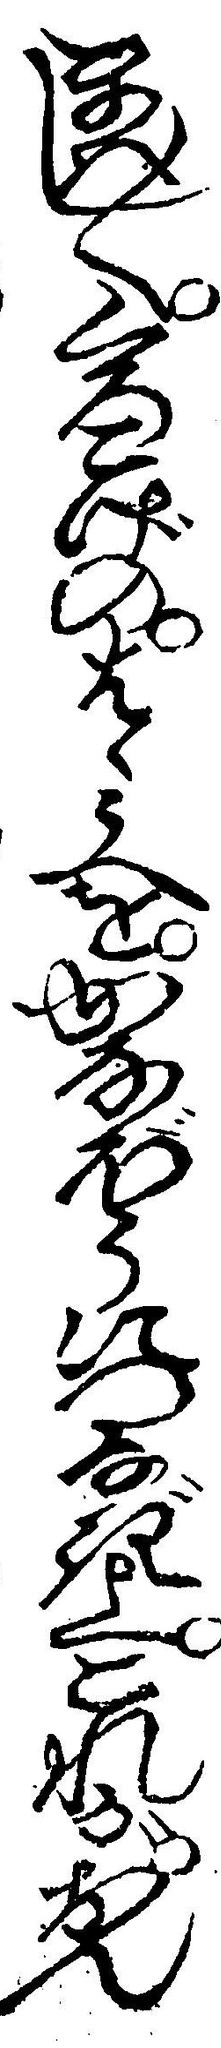まはし〳〵。くろこげの。はゝうへを。かなぼうにつなぎ上。これが。おん
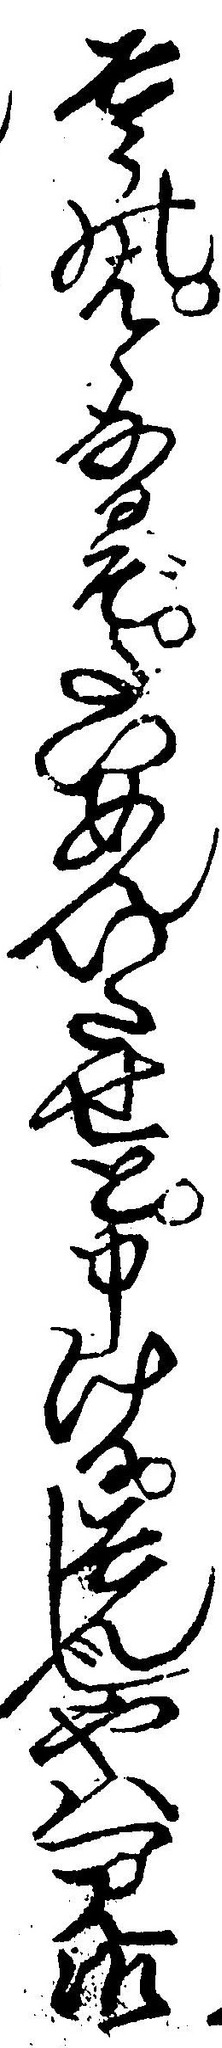そうの。はゝなるぞ。たいめんいたせと。申ける。そんじやは一見御
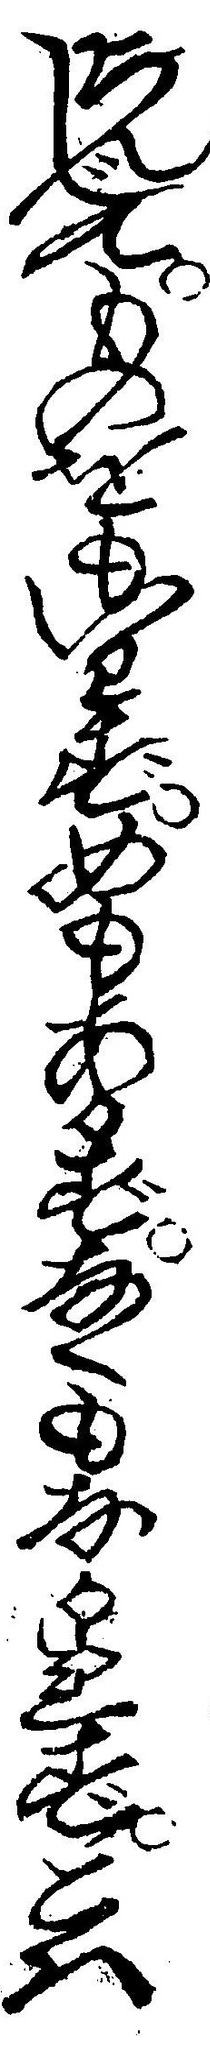らんじて。ものをもいわず。めもあかず。なくもなかれず。こは

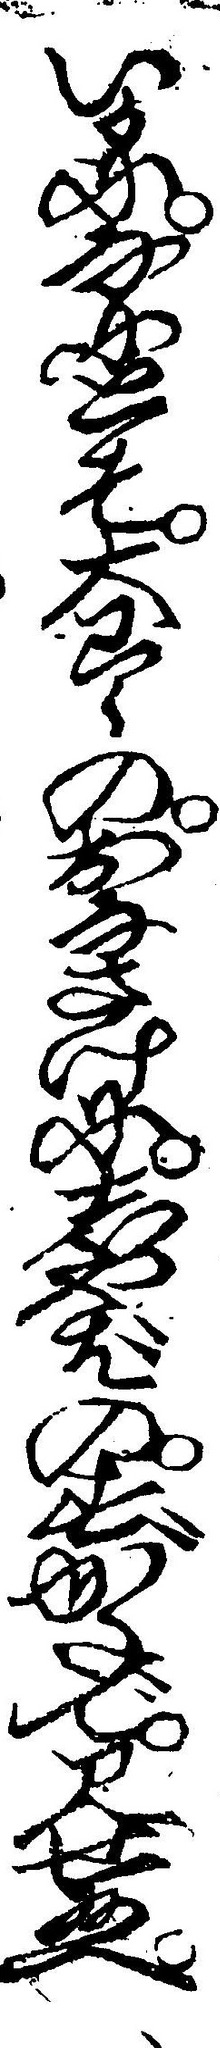いかに。なにとそ。大わうの。おなさけに。しやばのすがたで。みせ給へ。
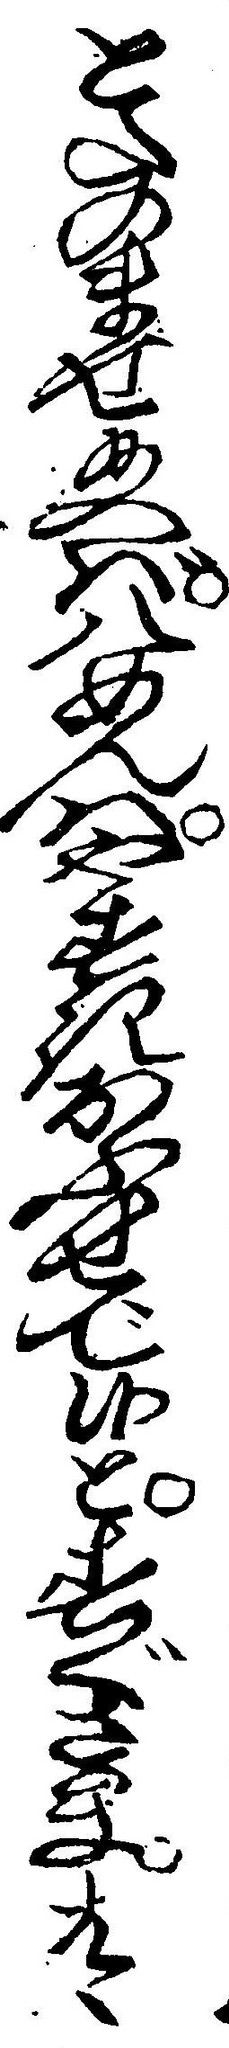とたのませ給へば。八めんは。やすきおふせで候と。すぐさま。はゝ
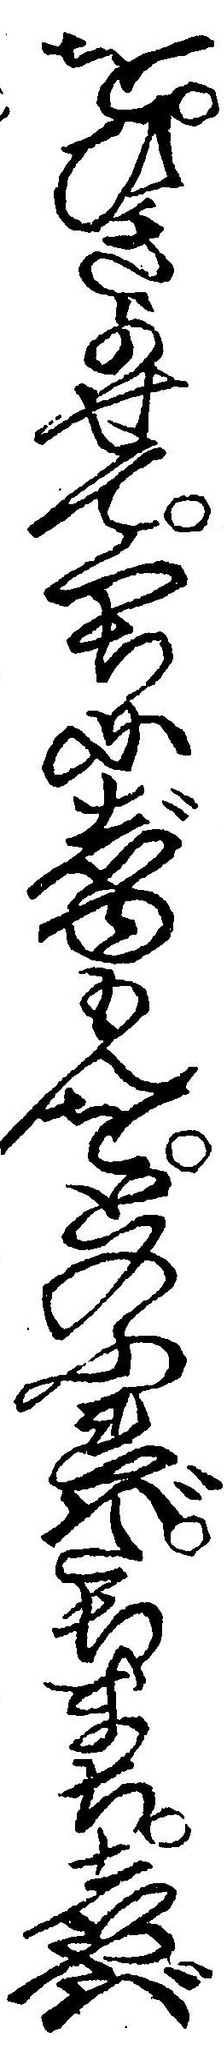を。ひきよせて。くちにじゆもんを。とのふれば。たちまち。しやば
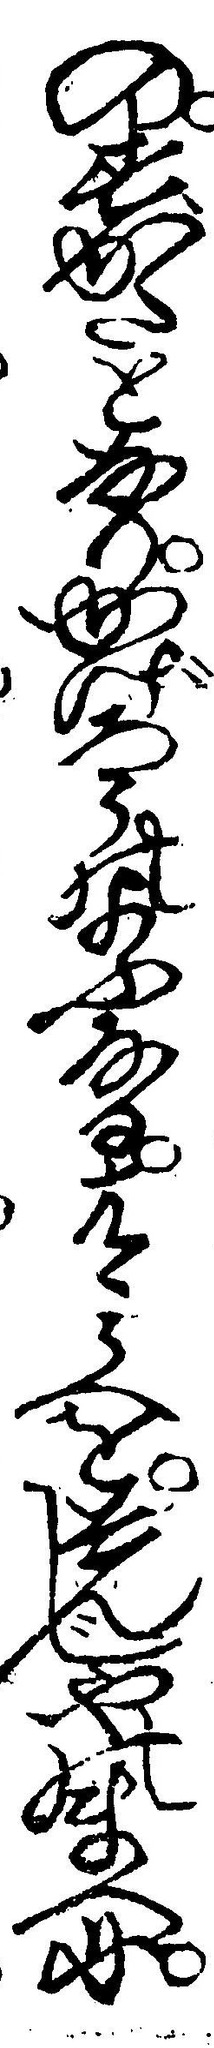の。すがたとなり。かげろうのよふなる。はゝうへを。そんじやのまへに。
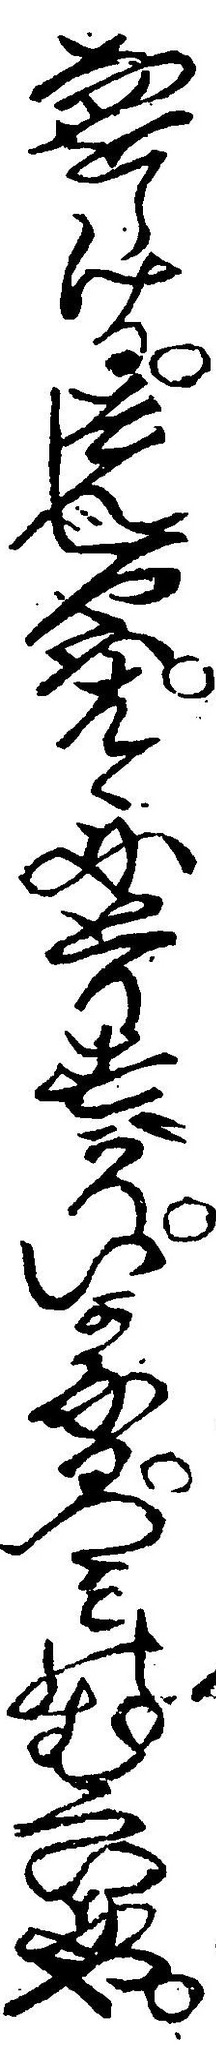なをしける。そんじやは。はゝにとりすがり。いかなる。つみのむくいにや。
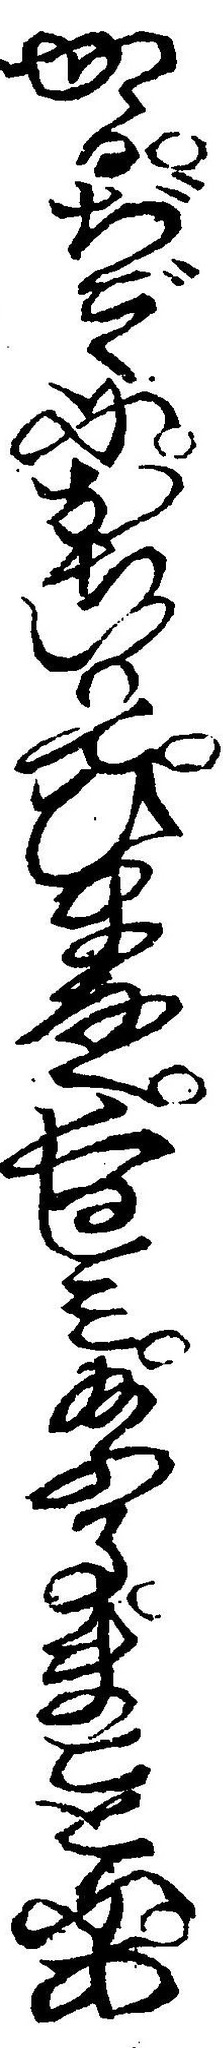かゝる。ぢごくに。おちいりて。ひまなく。くるしみ。給ふ事。まことに。あ
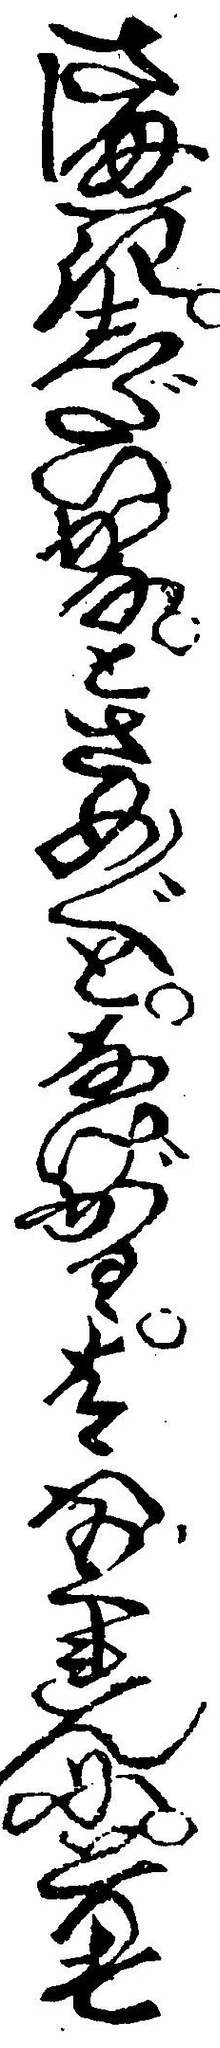さましき。しだいかな。とさめ〴〵となげかるゝ。はゝはもくれんに。とりす
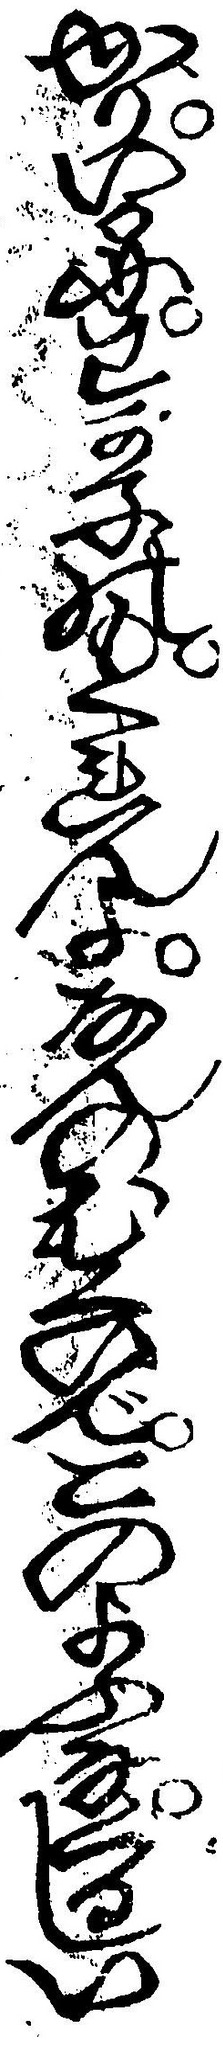かり。いかに。わか子の。もくれんよ。なんのむくいで。このよふな。くるしい
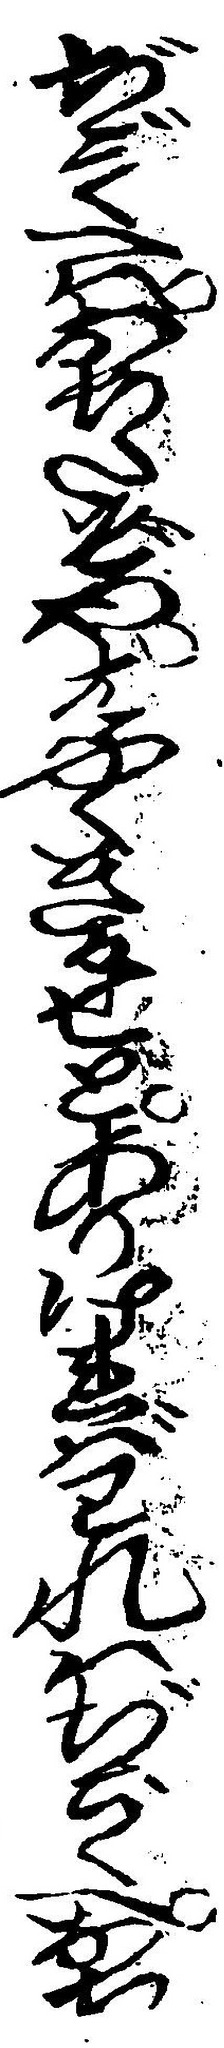ぢごくへは。おちたぞや。はやくきかせと。ありければ。われはぢごくへ。おち
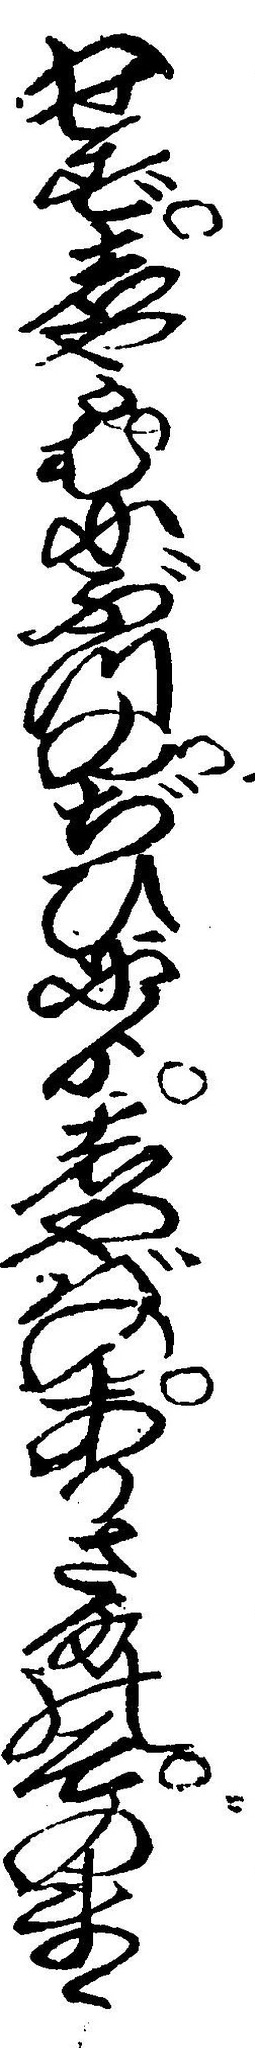はせず。しやかむにぶつの。ぢひにゟ。しやばのありさまの。そのまゝ
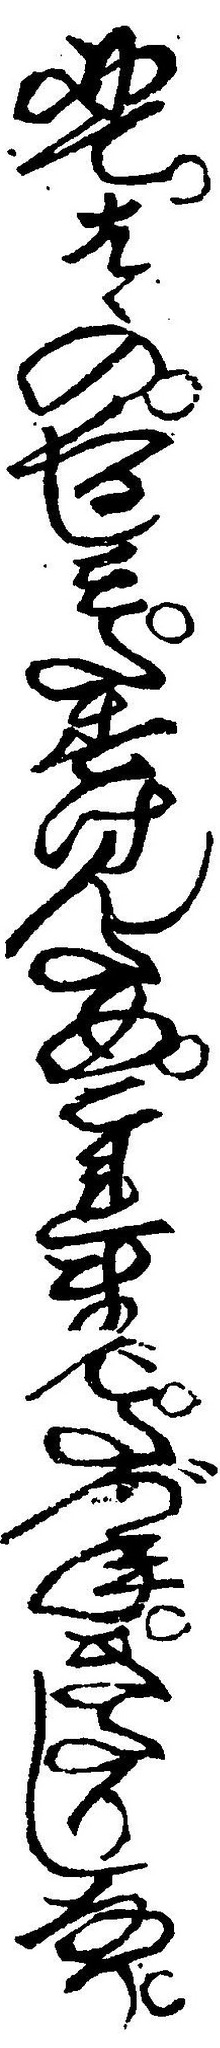にて。はゝのくるしみ。たすけんため。これまで。たづね。きたりしなり。
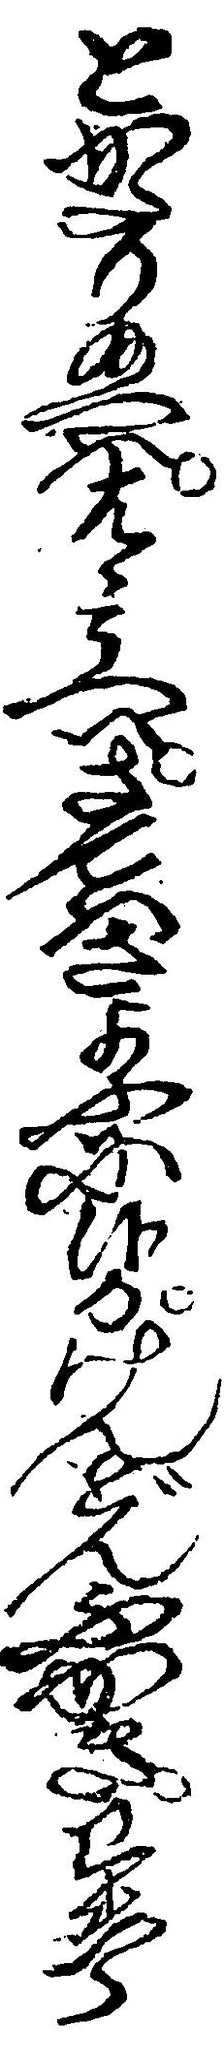とかたり給へは。はゝうへは。さてはさよふに候か。けんどんふかき。われら
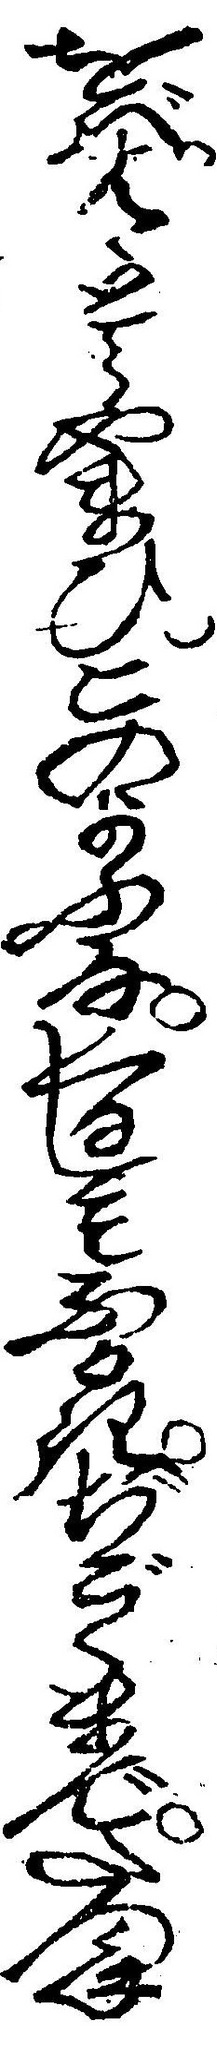をば。はゝとうやまひ。このよふな。くるしみふかき。ぢごくまで。たつね
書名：目連尊者地獄めくり / 宇留藤太夫正本
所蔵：東京大学総合図書館 General Library in the University of Tokyo, JAPAN
